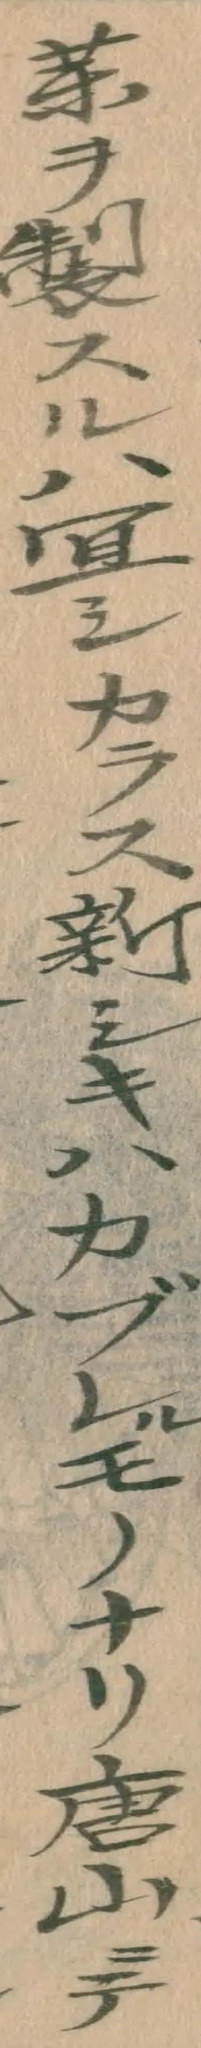薬ヲ製スルハ宜シカラス新シキハカブレルモノナリ唐山ニテ
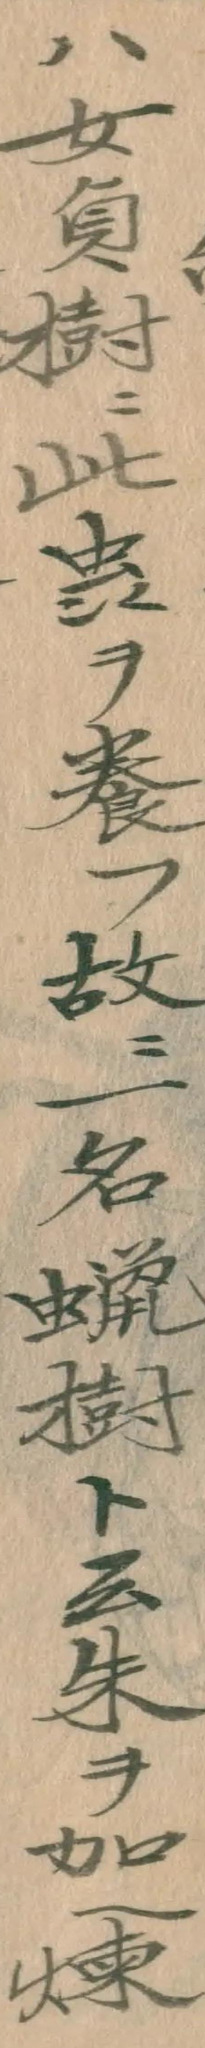ハ女貞樹ニ此蟲ヲ養フ故ニ一名蠟樹ト云朱ヲ加ヘ煉
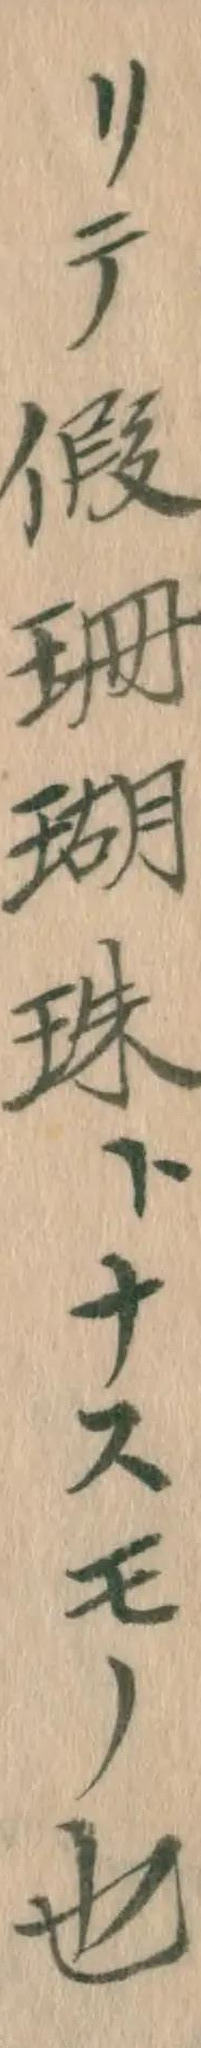リテ假珊瑚珠トナスモノ也

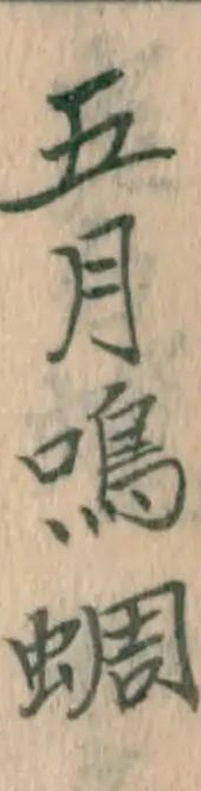五月鳴蜩
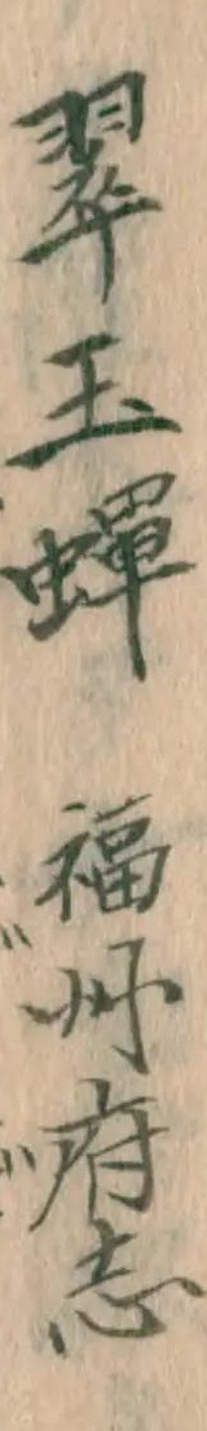翠玉蟬福州府志
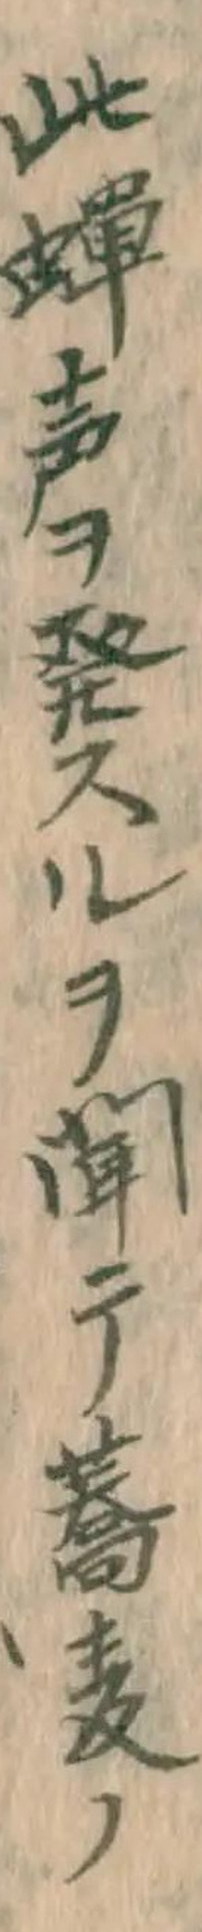此蟬声ヲ発スルヲ聞テ蕎麦ノ
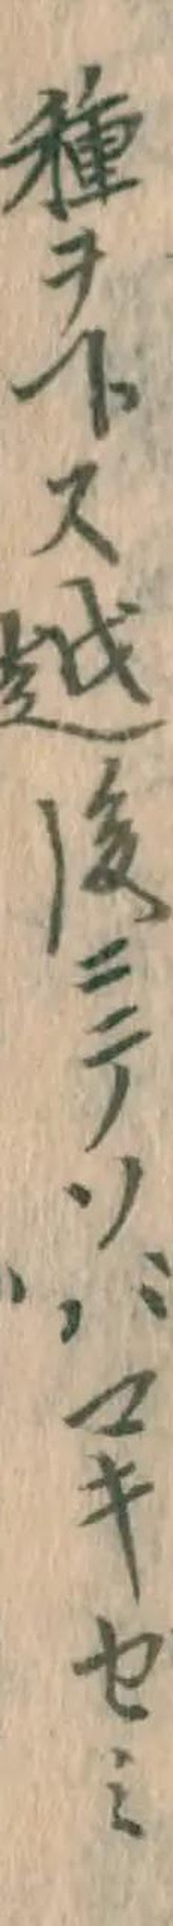種ヲ下ス越後ニテソバマキゼミ
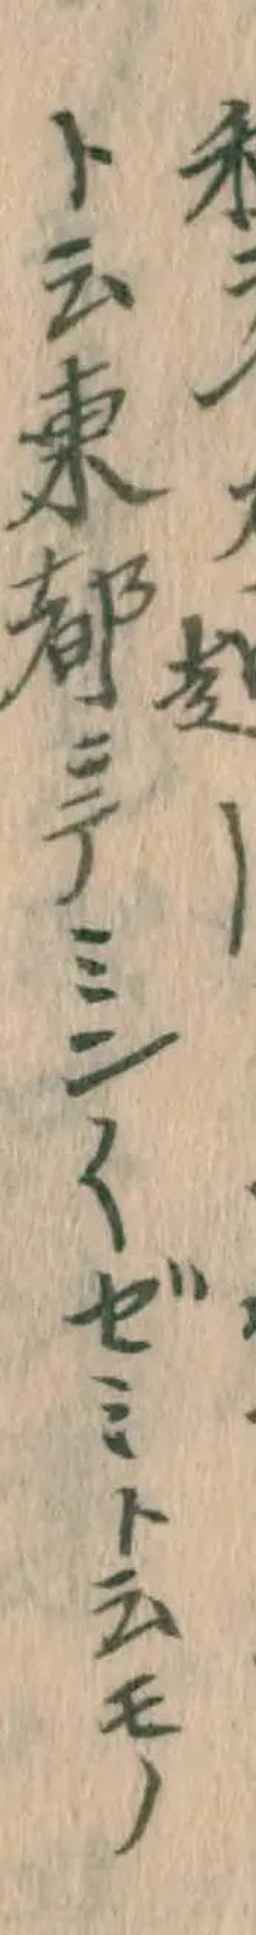ト云東都ニテミン〳〵ゼミト云モノ
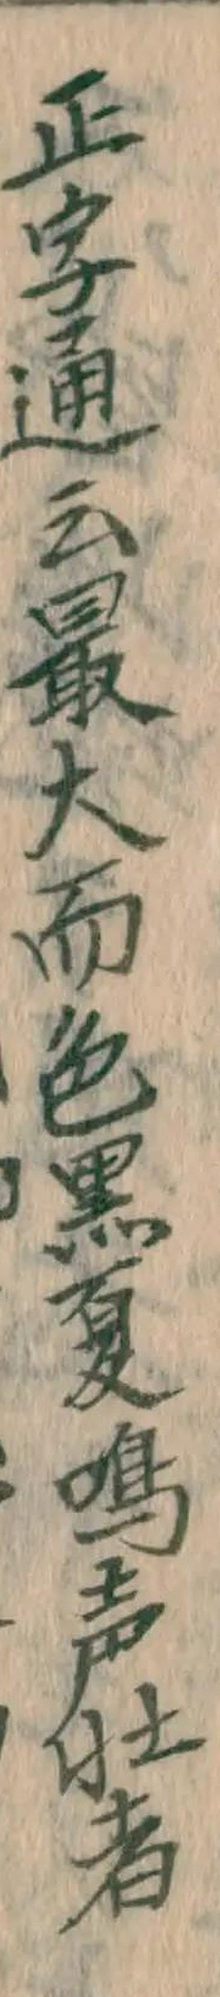正字通云最大而色黒夏鳴声壮者
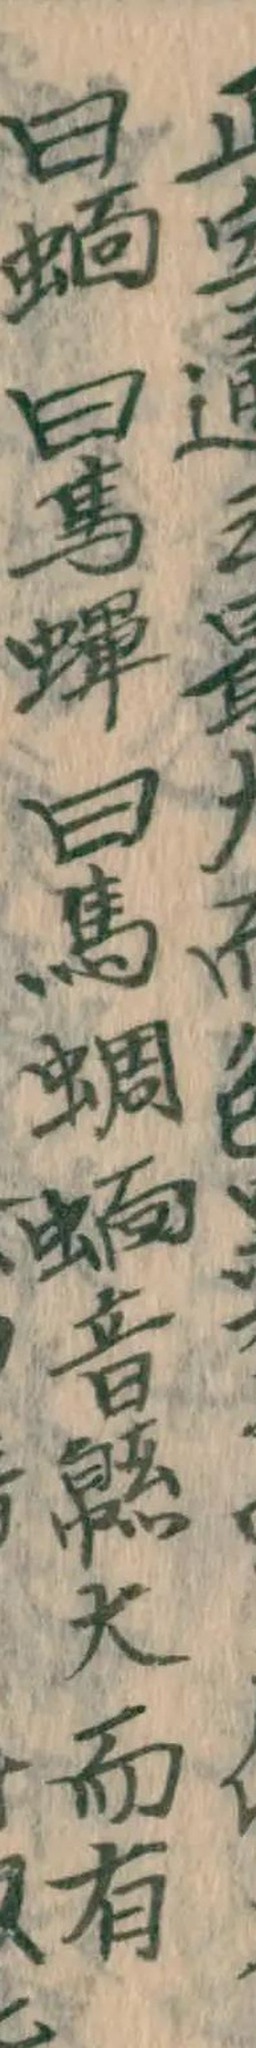曰蝒曰馬蜩曰馬蜩蝒音緜大而有
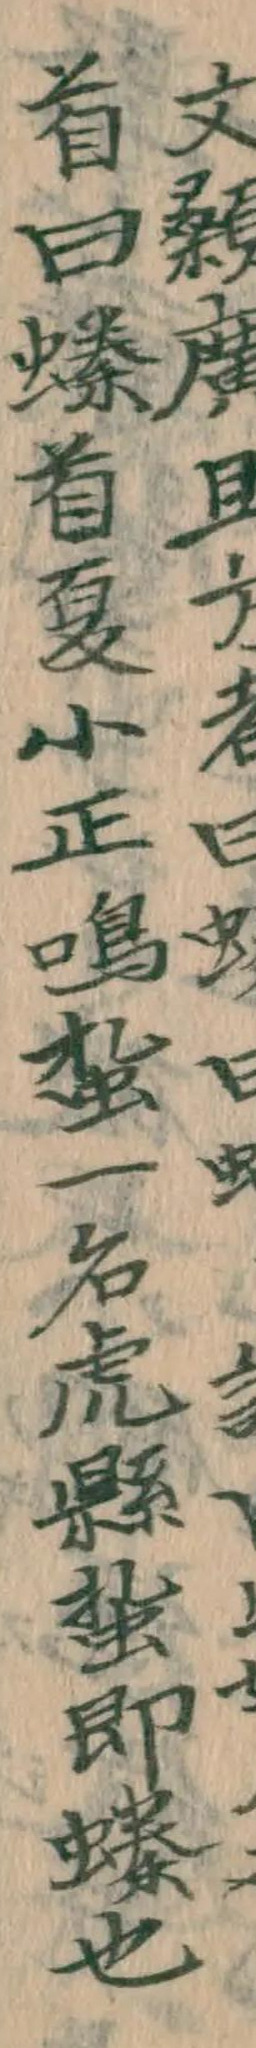首曰螓首夏小正鳴蚻一名虎縣蚻即螓也
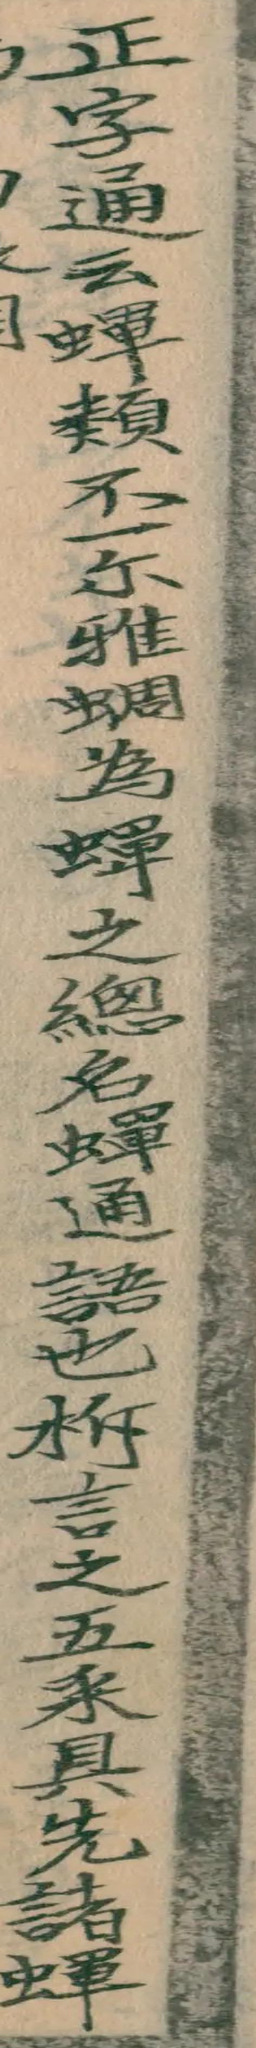正字通云蟬類不一尓雅蜩為蟬之總名蟬通語也柝言之五釆具先諸蟬
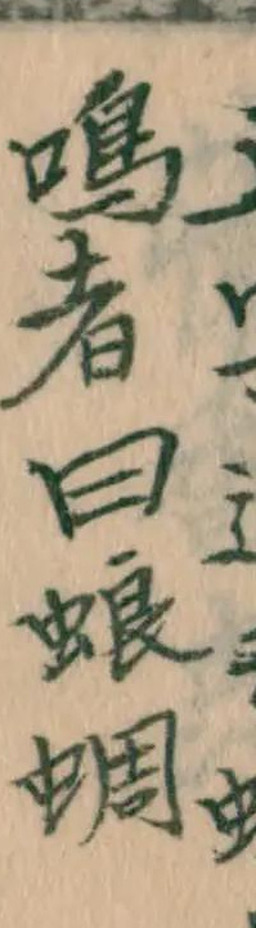鳴者曰蜋蜩

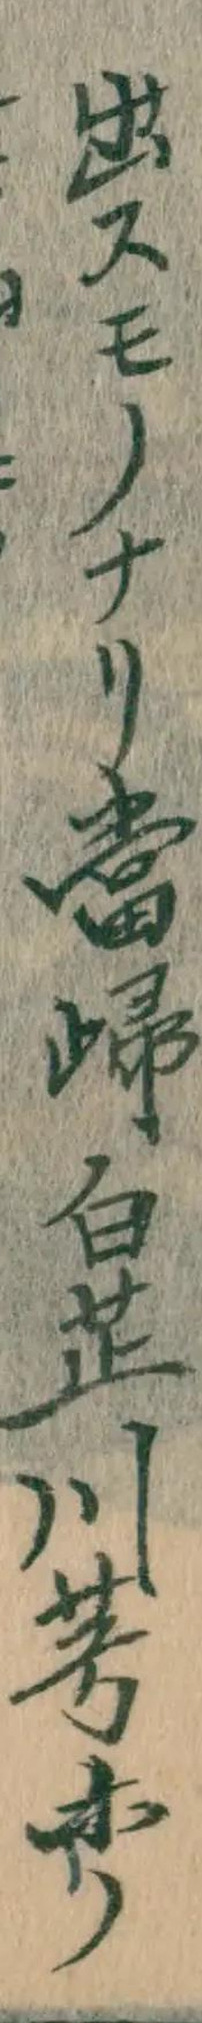出スモノナリ當㱕白芷川芎等ノ
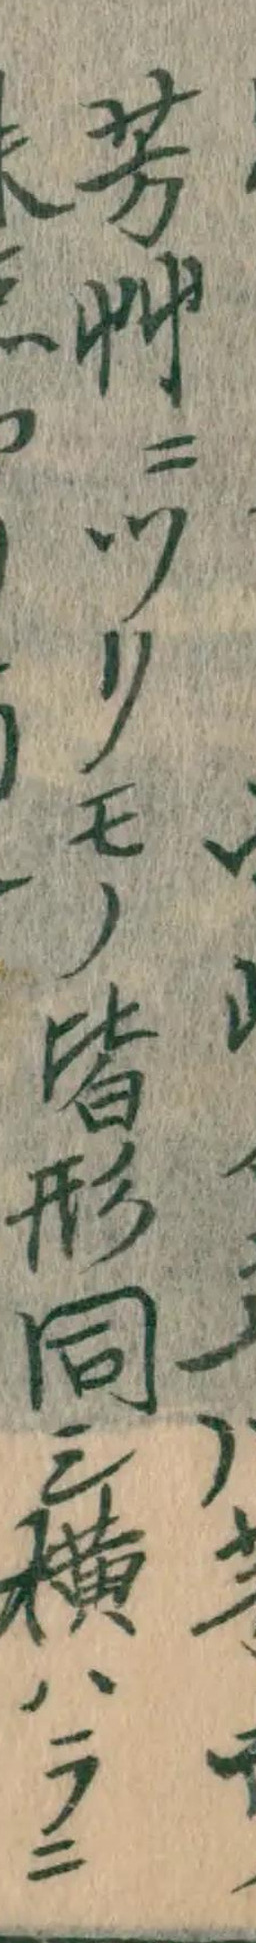芳艸ニツクモノ皆形同シ横ハラニ
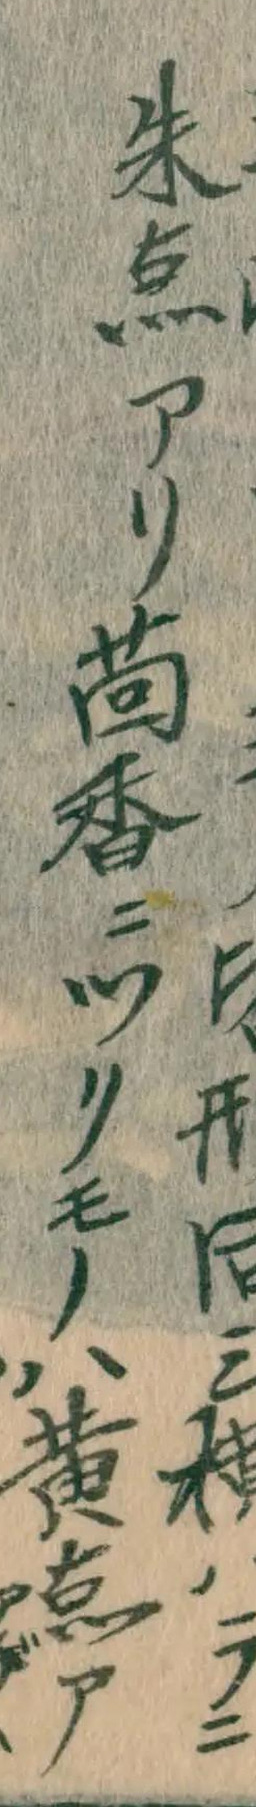朱点アリ茴香ニツクモノハ黄天ア
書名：千蟲譜 3巻. [1]
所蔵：国立国会図書館 National Diet Library, JAPAN
